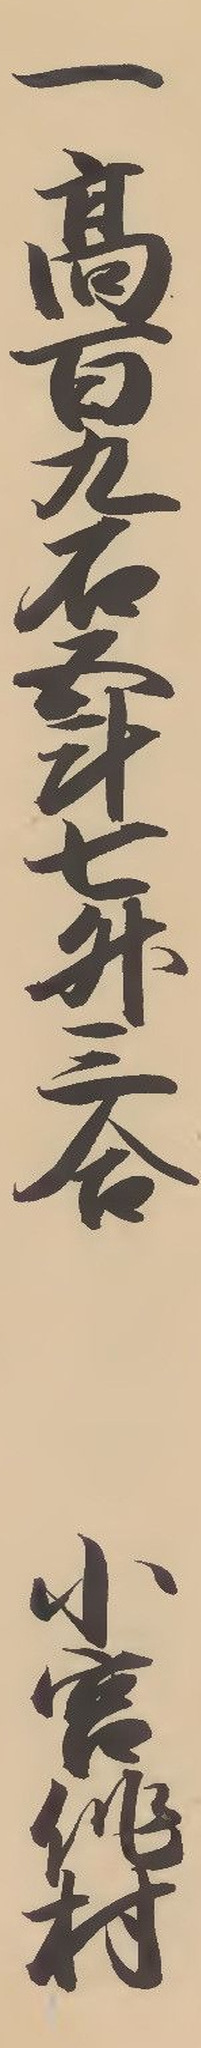一高百九石五斗七升三合小宮作村
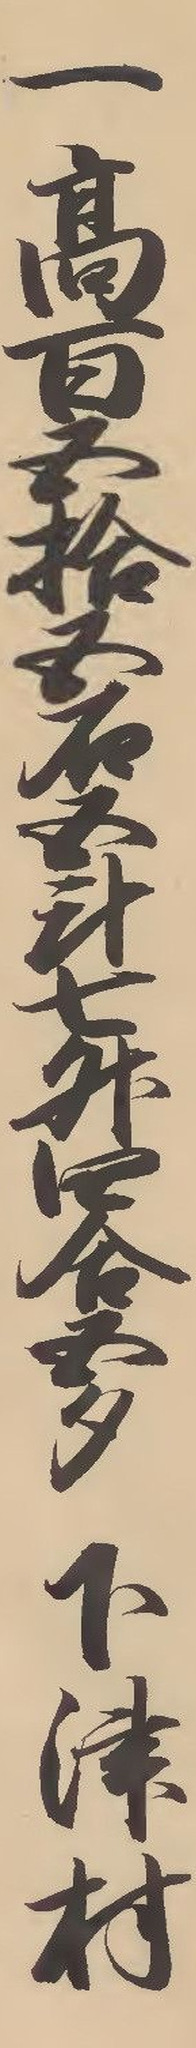一高百五拾五石五斗七升四合五勺下津村
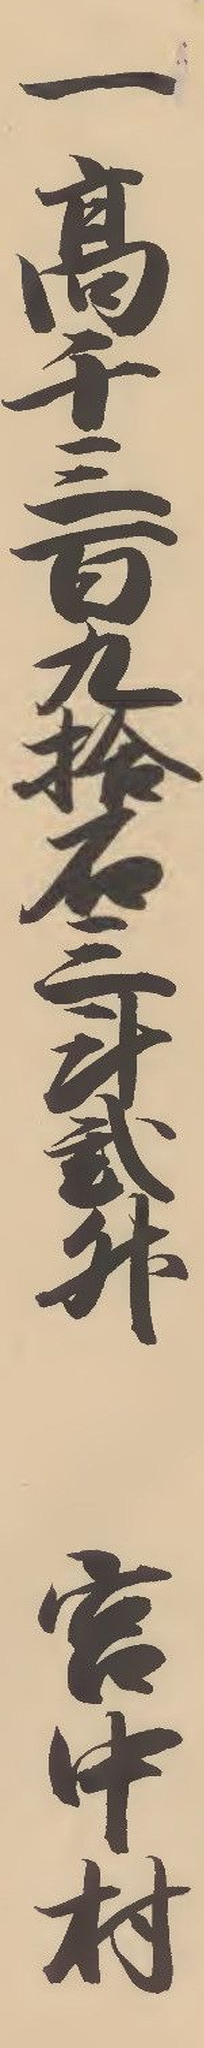一高千三百九拾石三斗弐升宮中村
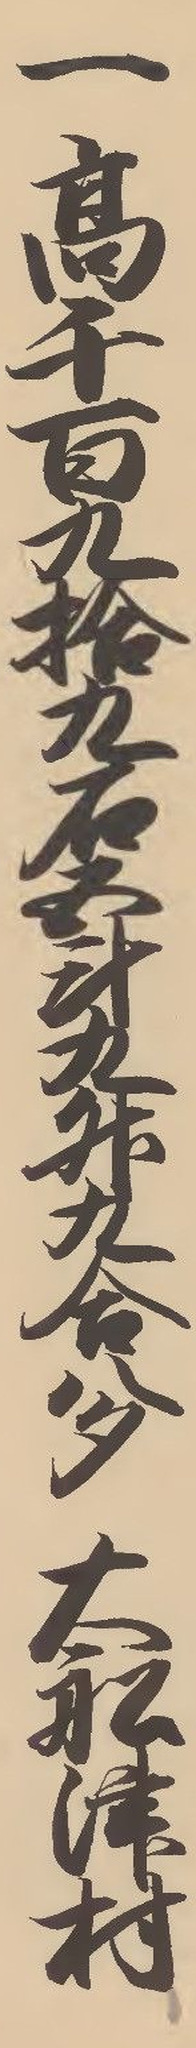一高千百九拾九石五斗九升九合八勺大船津村
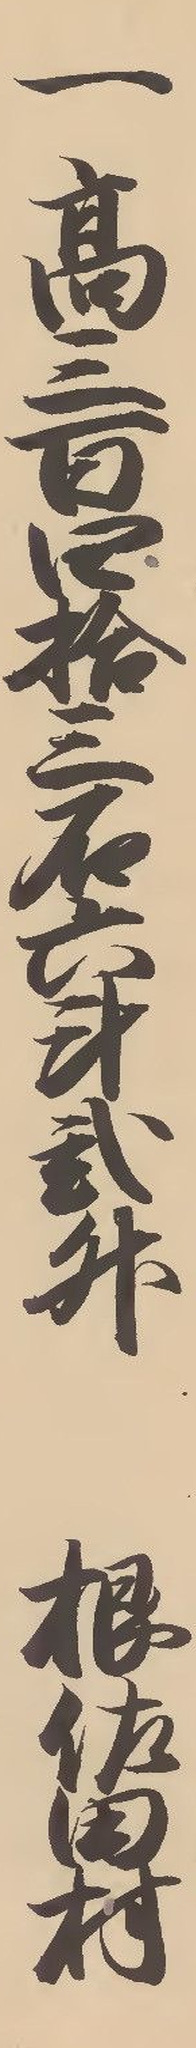一高三百四拾三石六斗弐升根佐田村
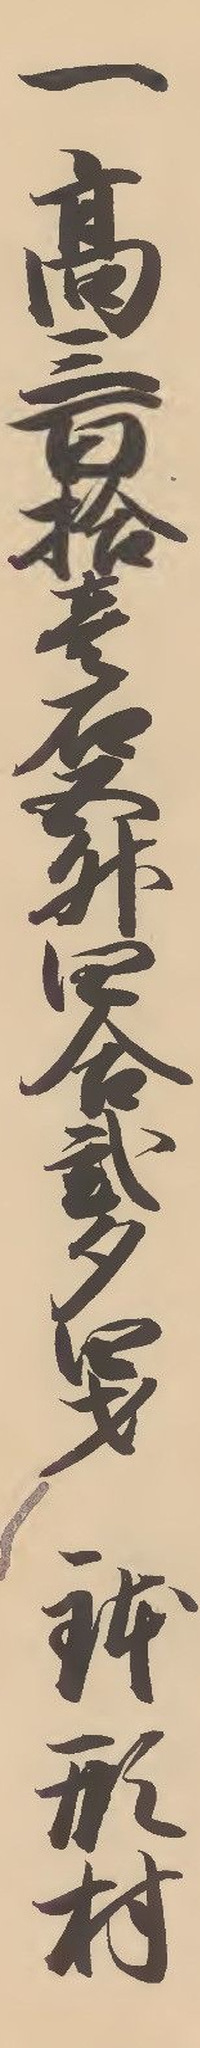一高三百拾壱石五升四合弐勺四才鉢形村

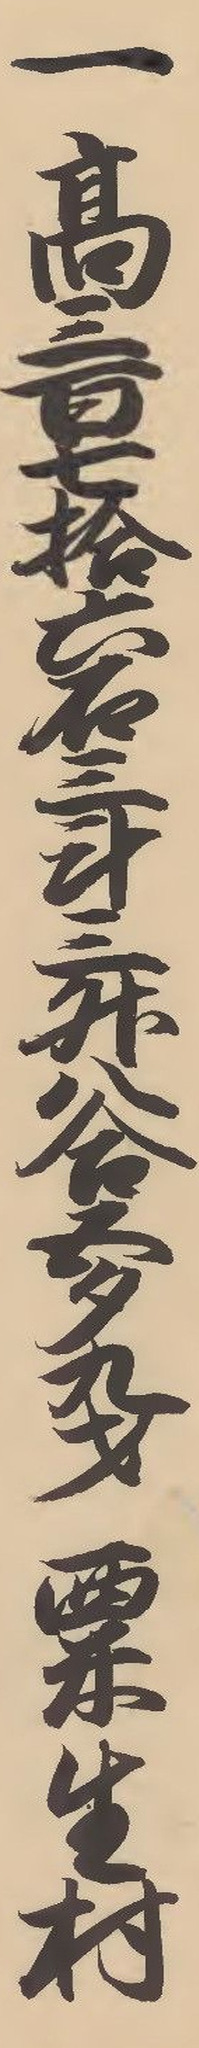一高三百七拾六石三斗三升八合五勺九才粟生村
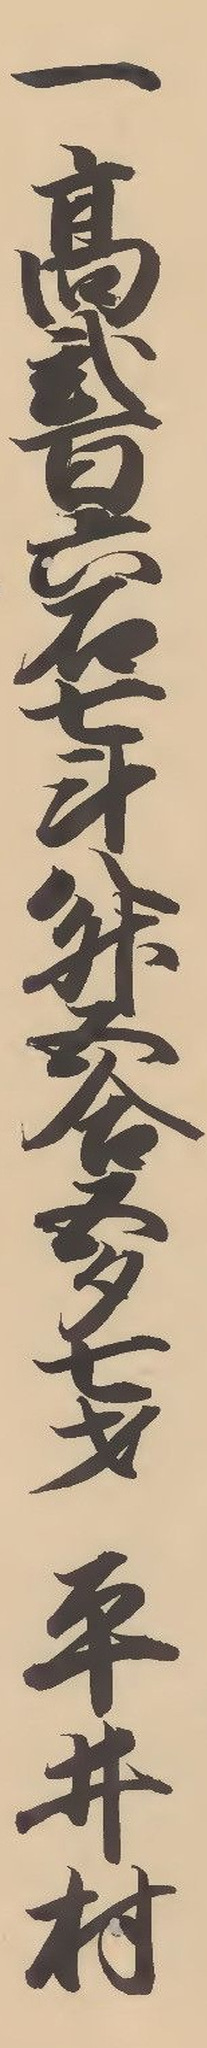一高弐百六石七斗八升五合五勺七才平井村
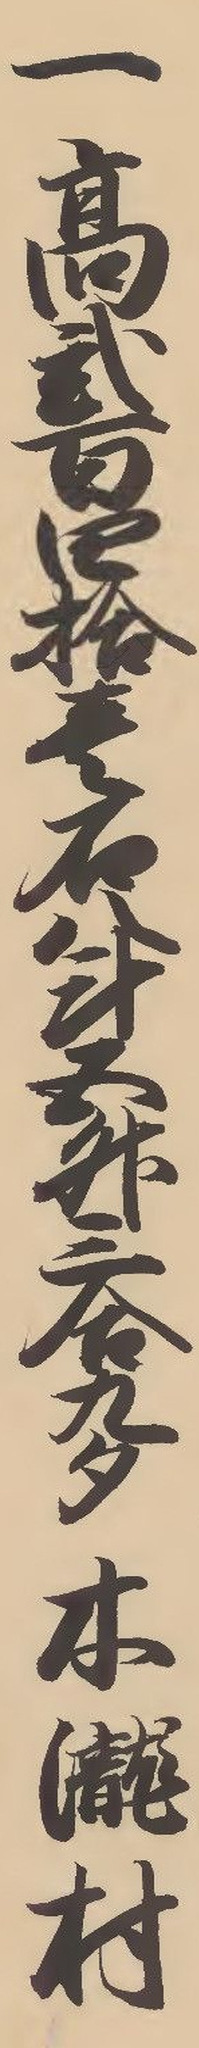一高弐百四拾壱石八斗五升三合九勺木滝村
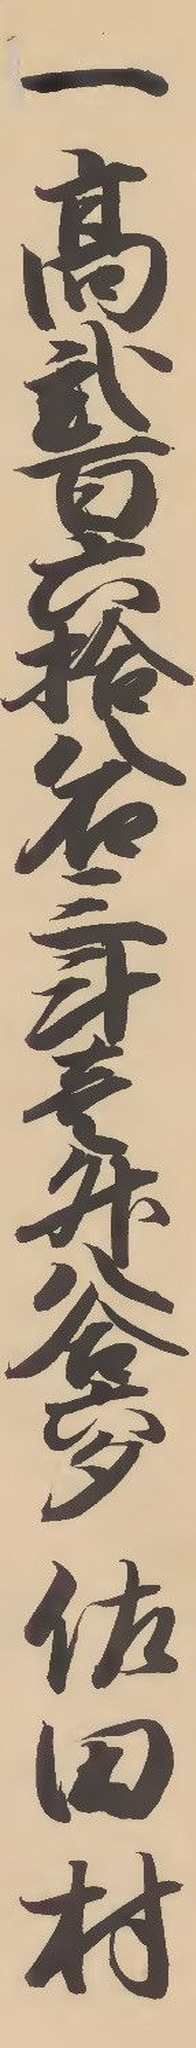一高弐百六拾八石三斗壱升八合六勺佐田村
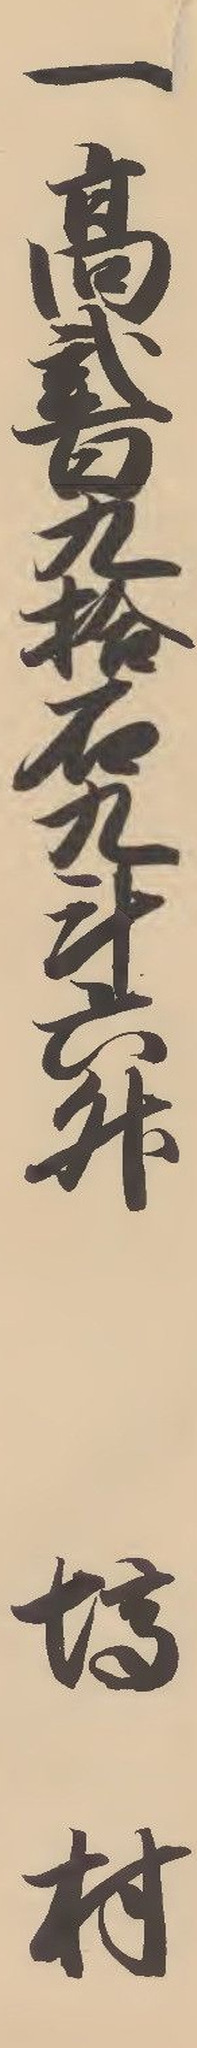一高弐百九拾石九斗六升塙村
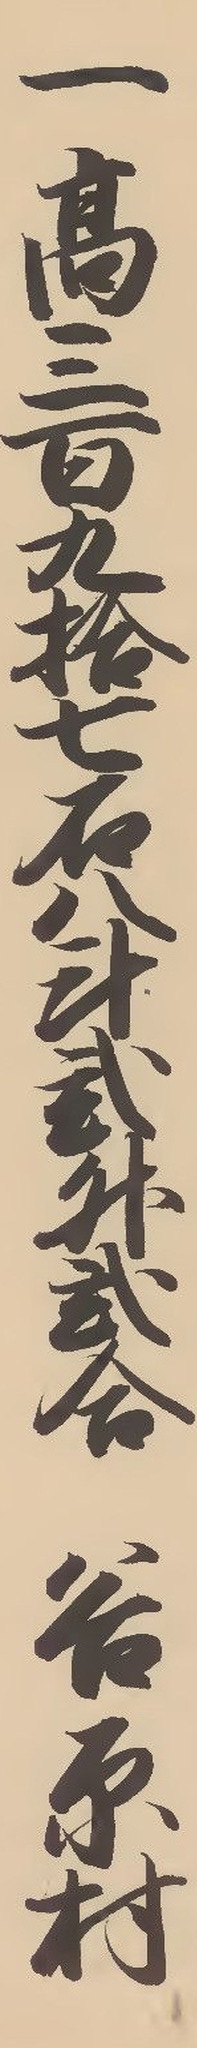一高三百九拾七石八斗弐升弐合谷原村
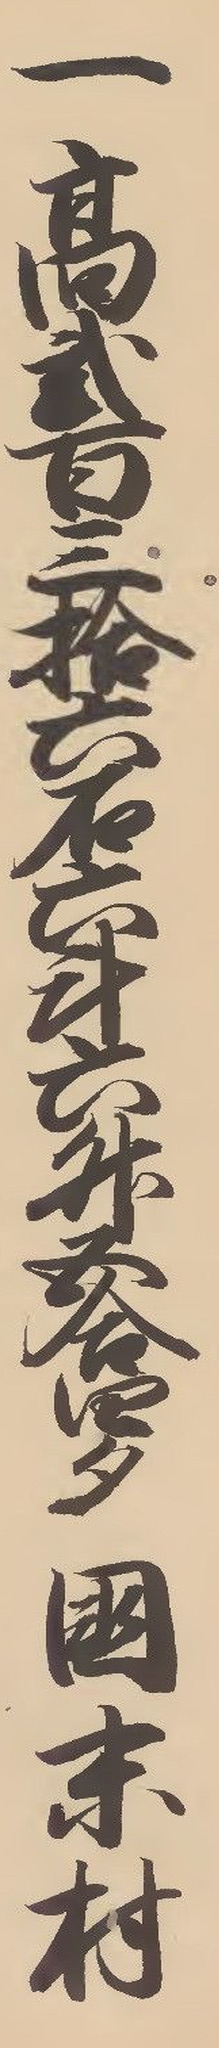一高弐百三拾六石六斗六升五合四勺国末村
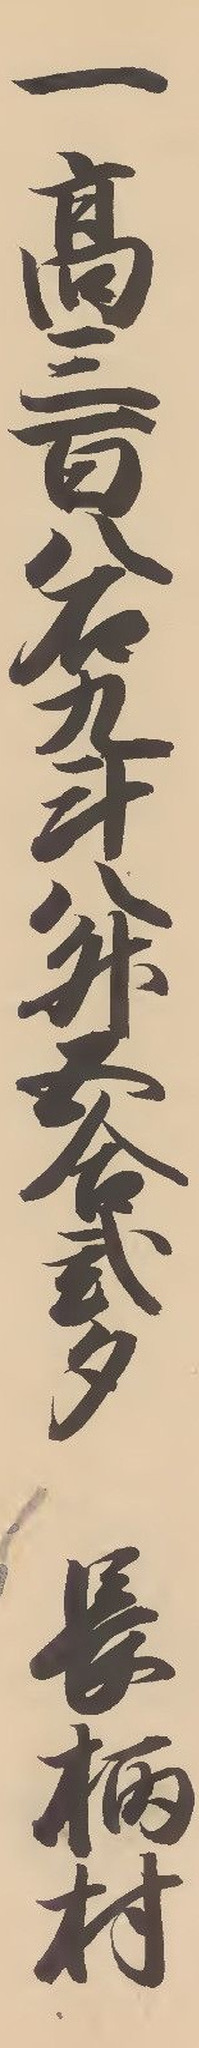一高三百八石九斗八升五合弐勺長柄村

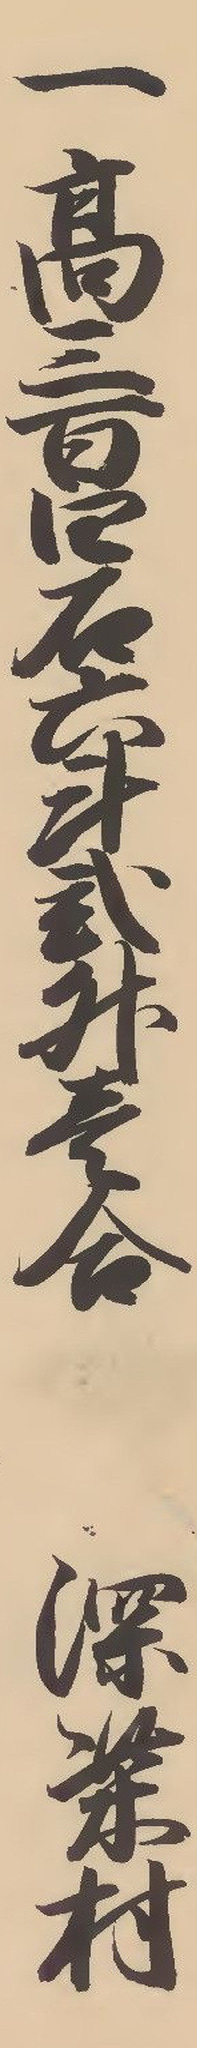一高三百四石六斗弐升壱合深芝村
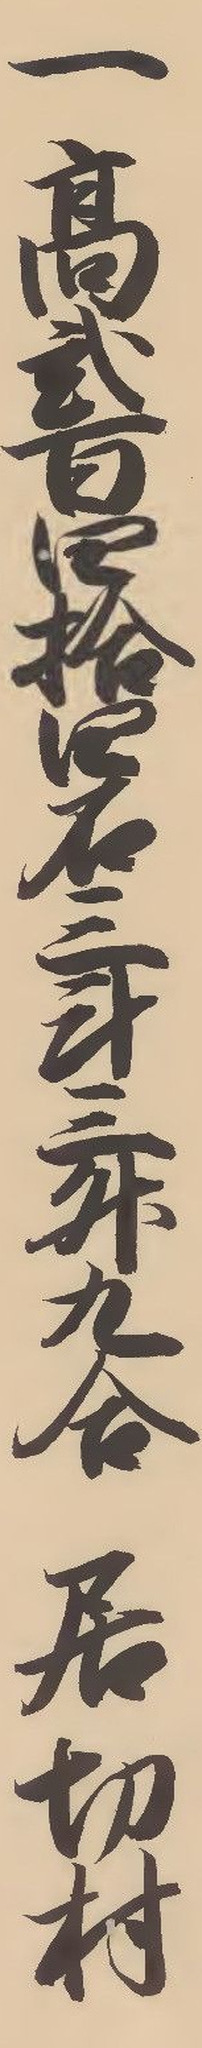一高弐百四拾四石三斗三升九合居切村
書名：常陸国郷帳
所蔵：国立公文書館 National Archives of Japan
